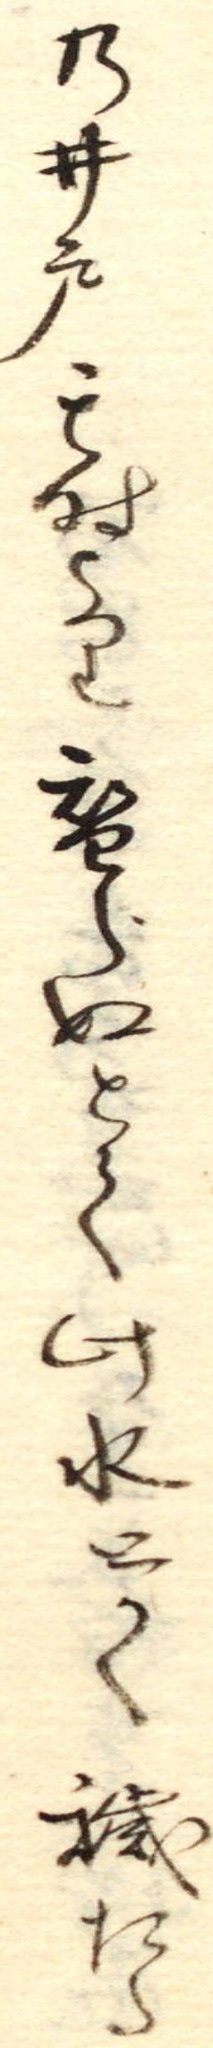の井戸其時より替らぬとて此水とかく穢たる
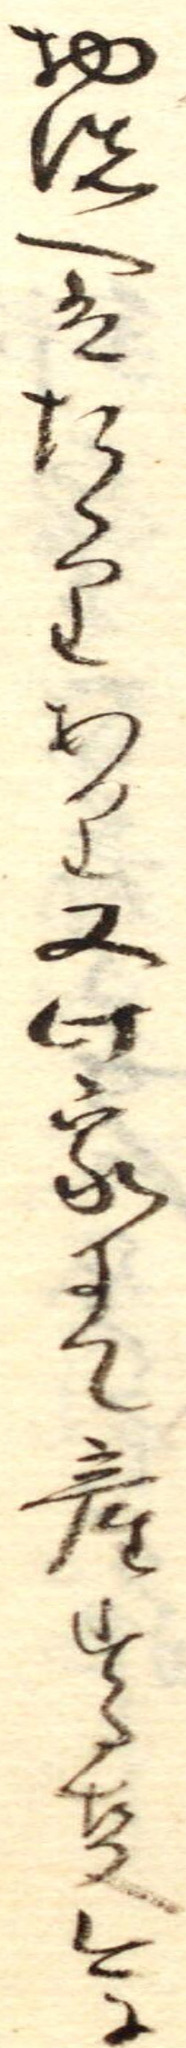物洗へはたゝりあり又此家にて産する事今に
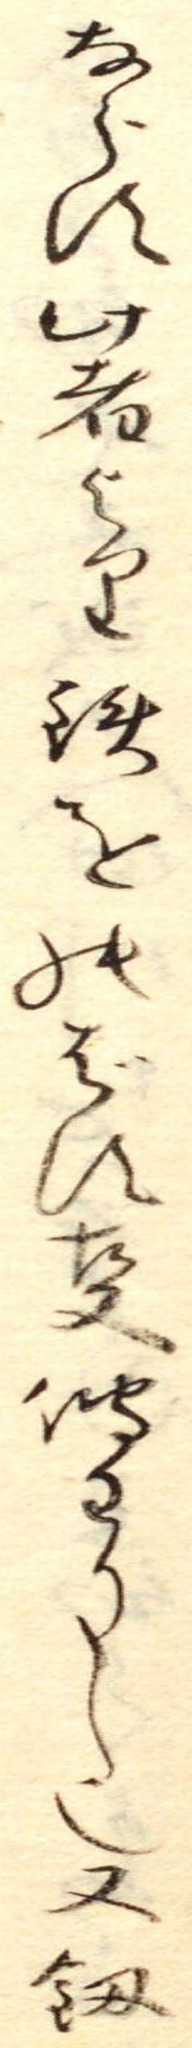ならす此者より鉄をのばす事伝わりし也又釼
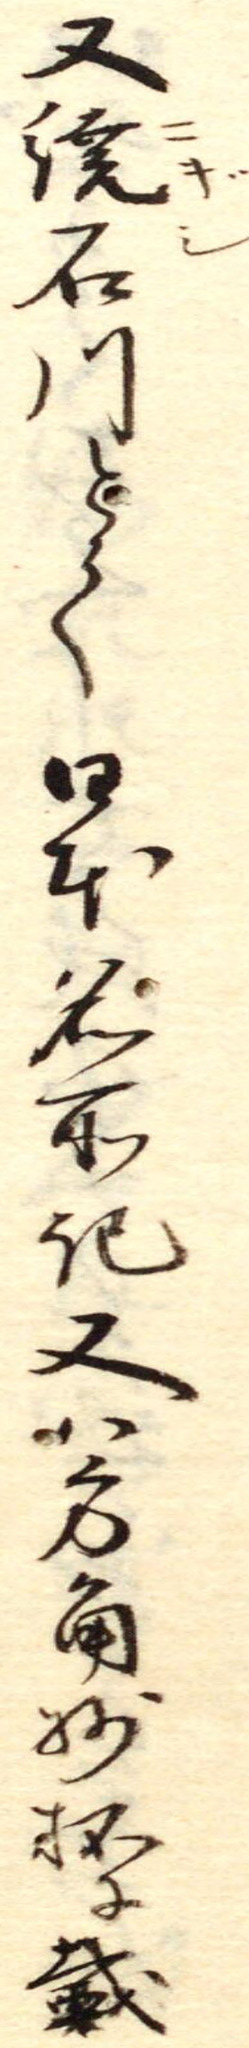又饒石川とて日本名所記又は方角抄抔に載
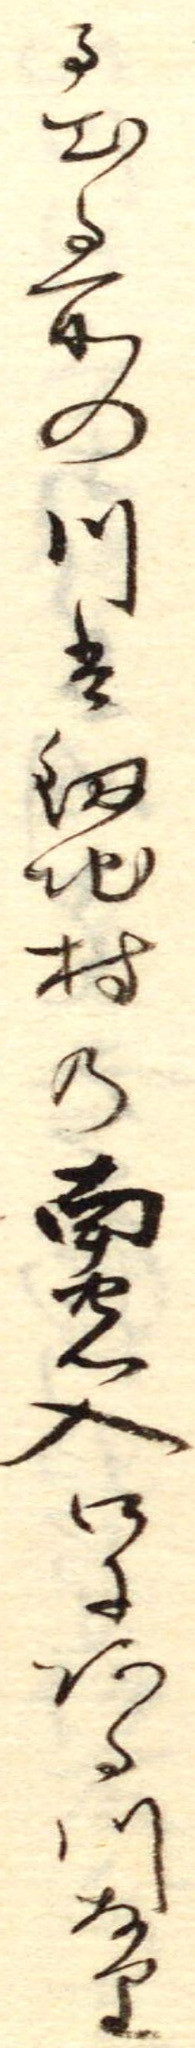る出る所の川は釼地村の南の入口にある川なり
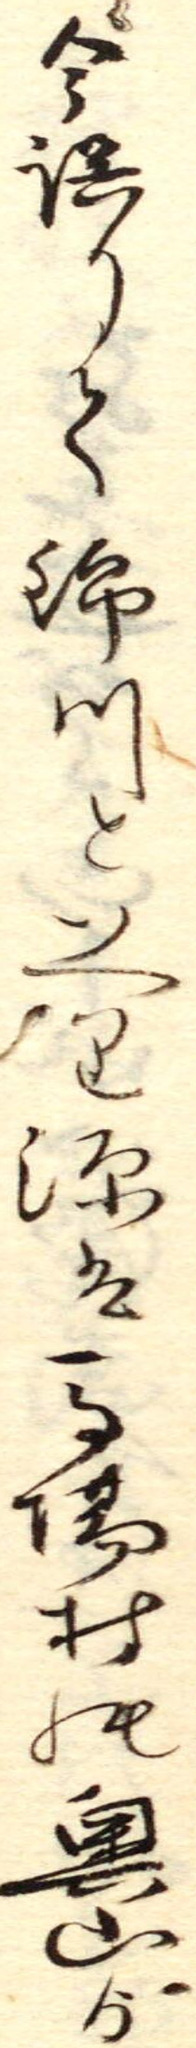今誤りて錦川といへり源は馬場村の奥山ゟ
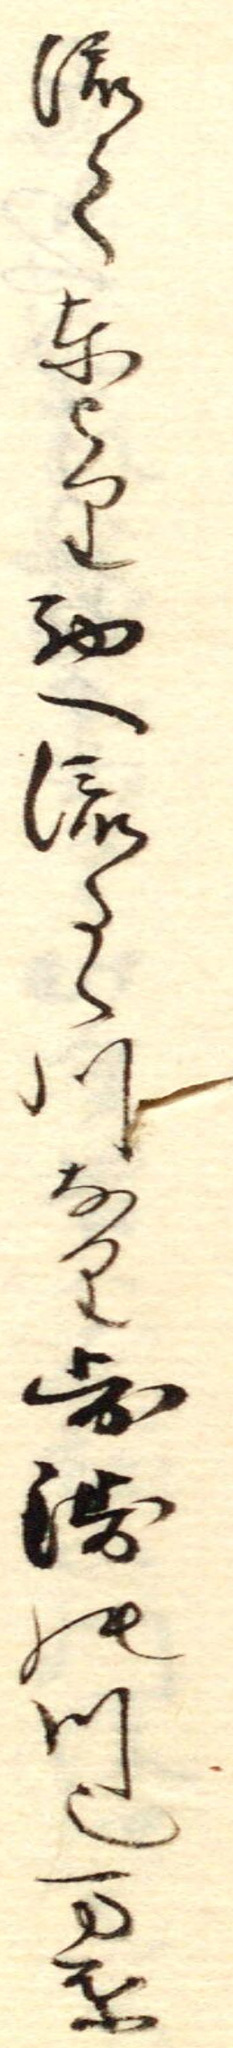流て東より西へ流るゝ川なり歩渉の川也万葉
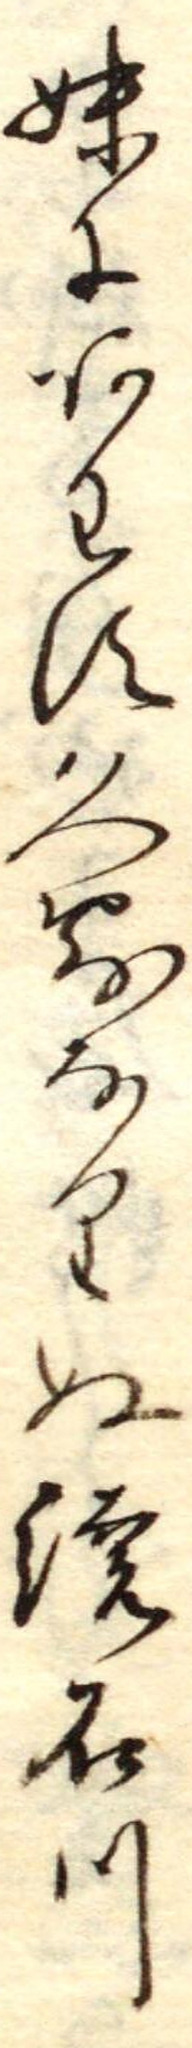妹にあわす久敷なりぬ饒石川
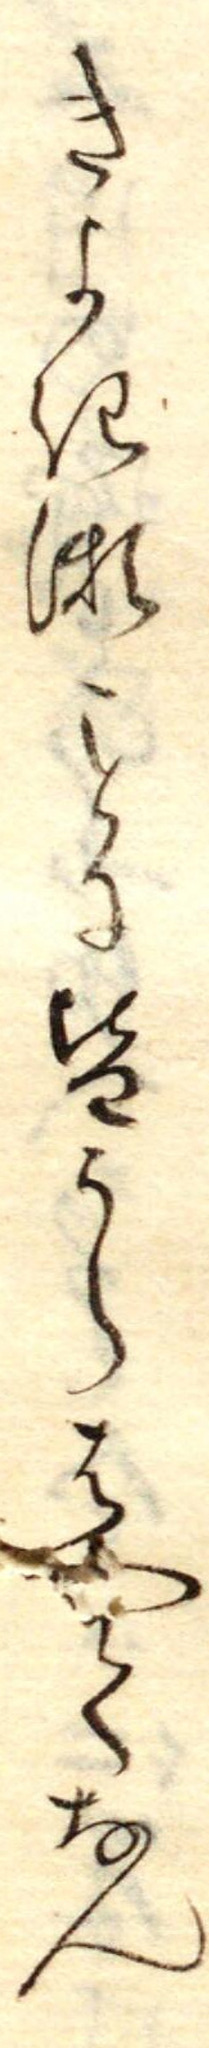きよき瀬ことに皆うらはへてなん

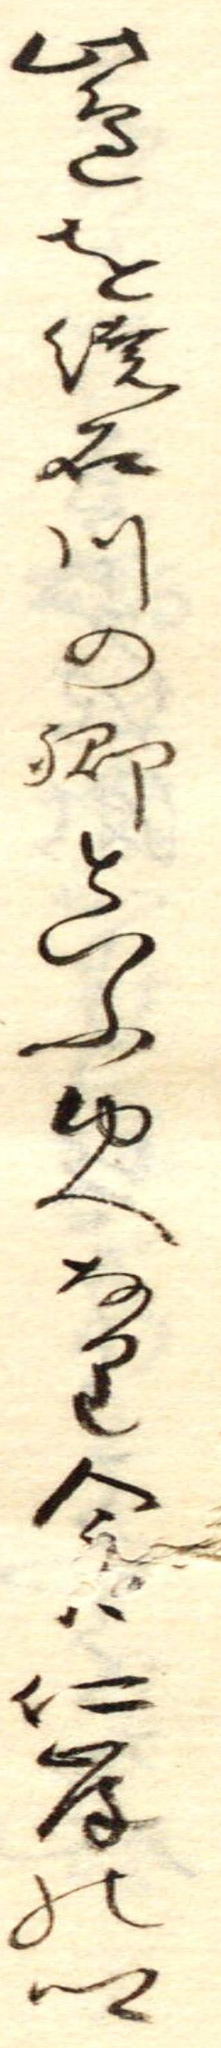此辺を饒石川の郷といふゆへなり今は仁岸の郷
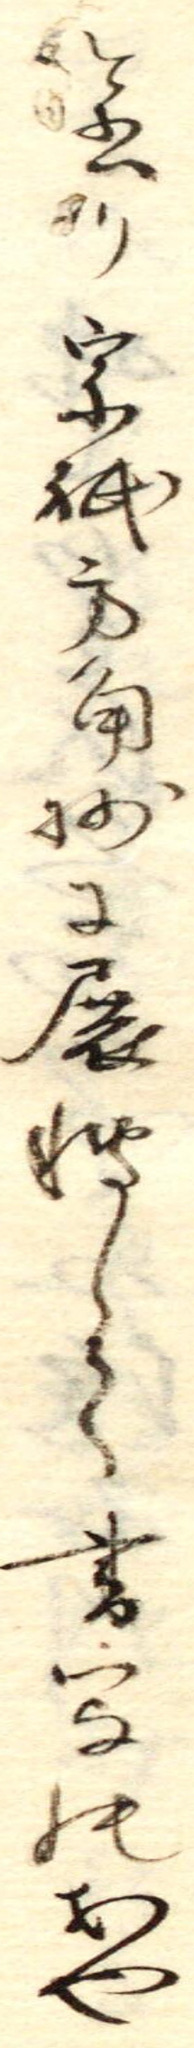と書に宗祇方角抄に展転して書写のあや
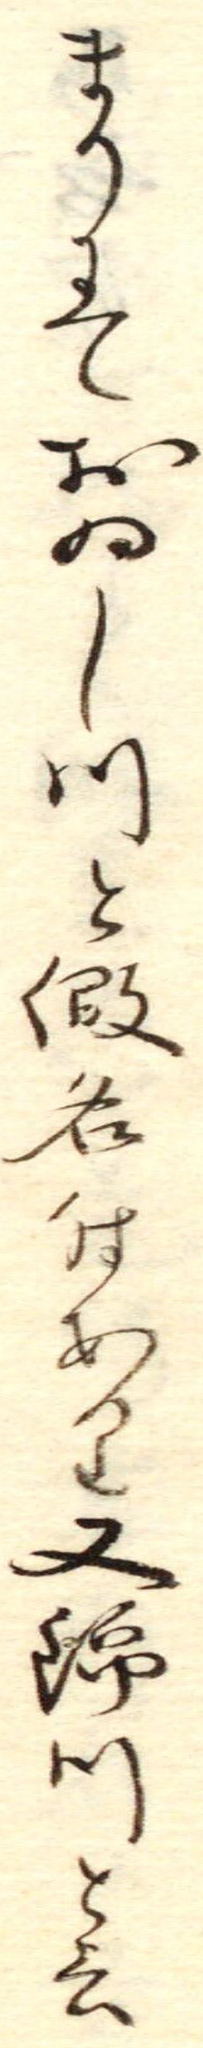まりにておゐし川と假名付あり又錦川と云
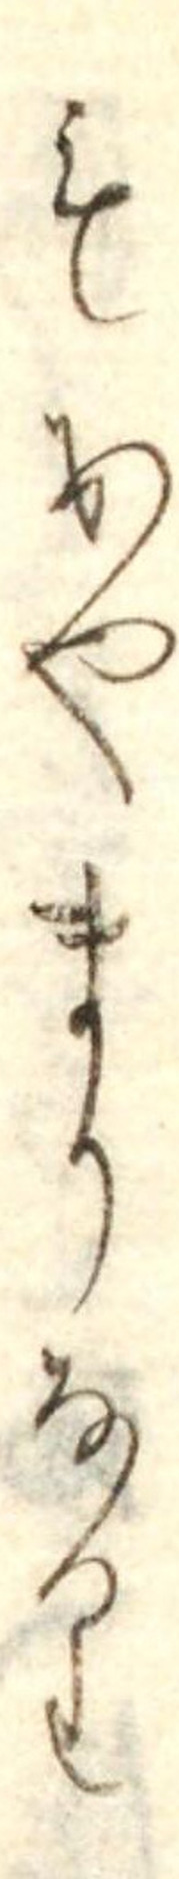もあやまりなり
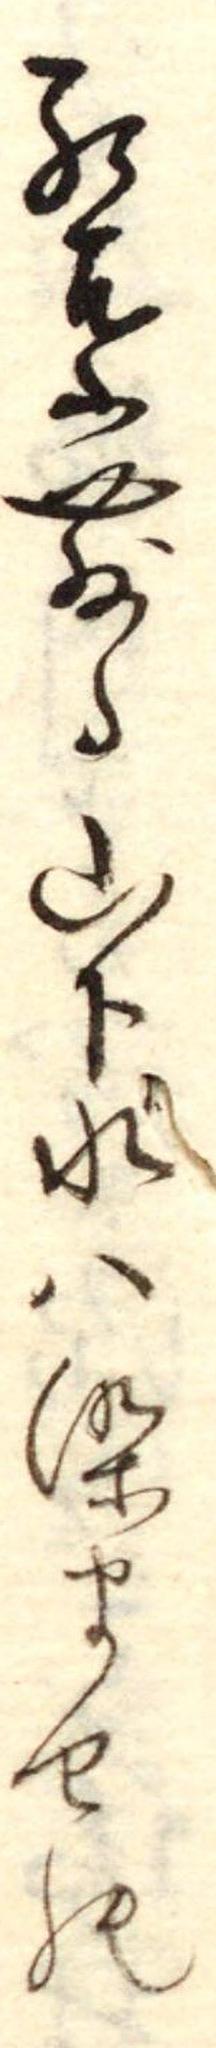若葉散る山下水は染ませの
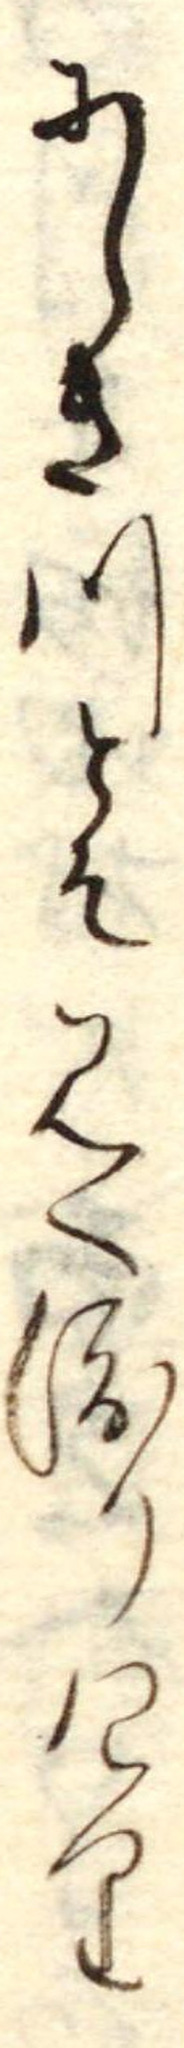にしき川とて見へ渡りけり
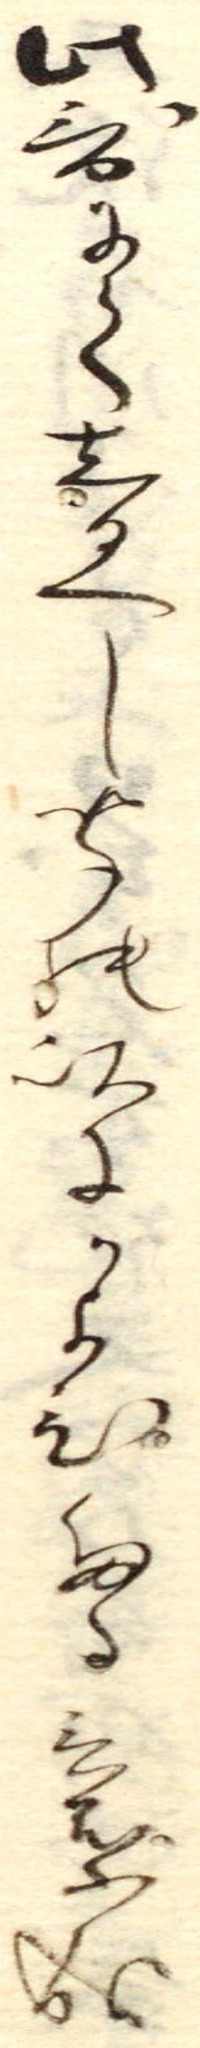此哥にてしるへし聞の以にかよひたる言葉成
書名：能登名跡誌
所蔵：Ishikawa Prefectural Library
